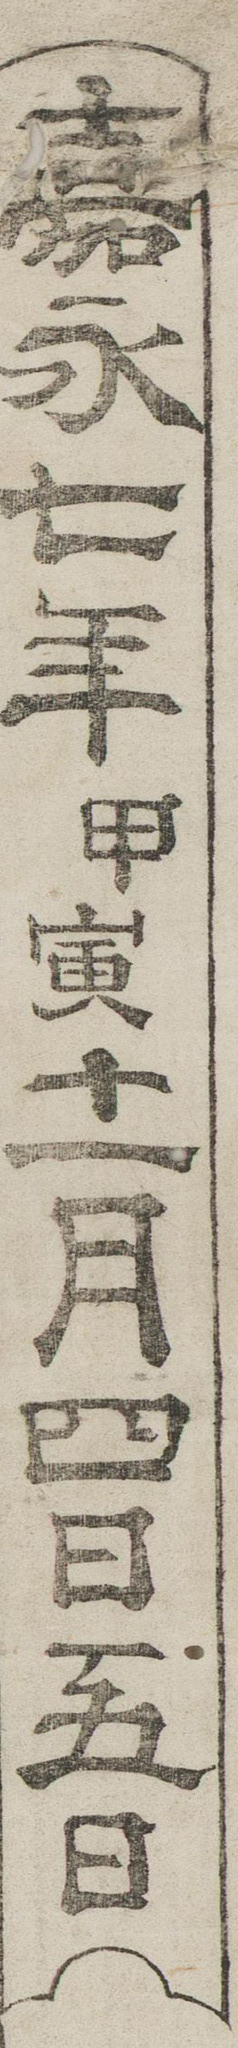嘉永七年甲寅十一月四日五
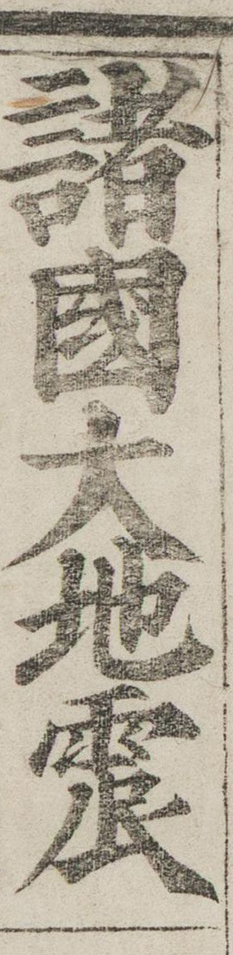諸国大地震
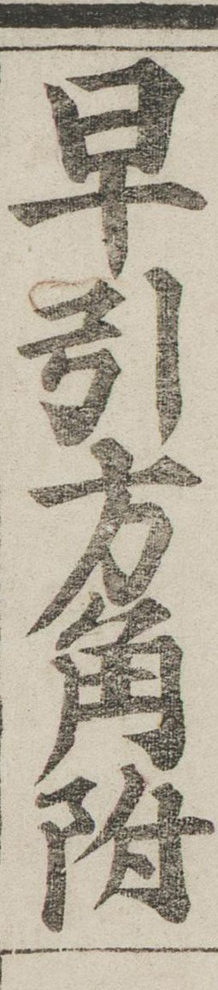早引方角附
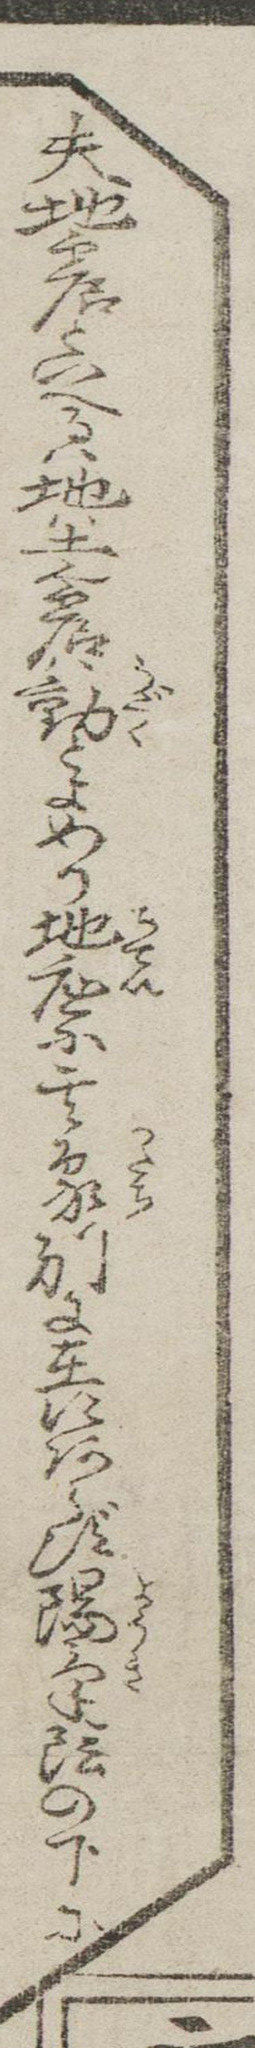夫地震といへるは地は土也震は動とよめり地底に其象別に在にあらず陽気陰の下に江戸
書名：諸國大地震大津波実説早引方角附　世直り一覧　嘉永七年甲寅十一月四日・五日
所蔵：東京大学地震研究所図書室 Earthquake Research Institute Library, The University of Tokyo, JAPAN
